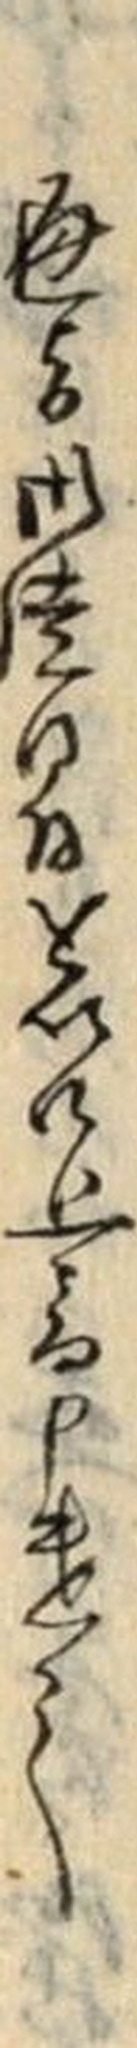通旨御徒目付を以口上に而申遣之
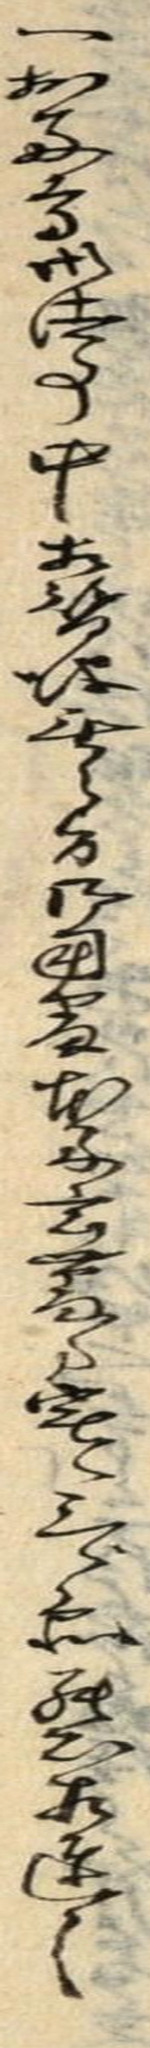一於両寺御法事中相替儀無之旨御用番本多玄蕃方宅へ三郎兵衛罷出相達之
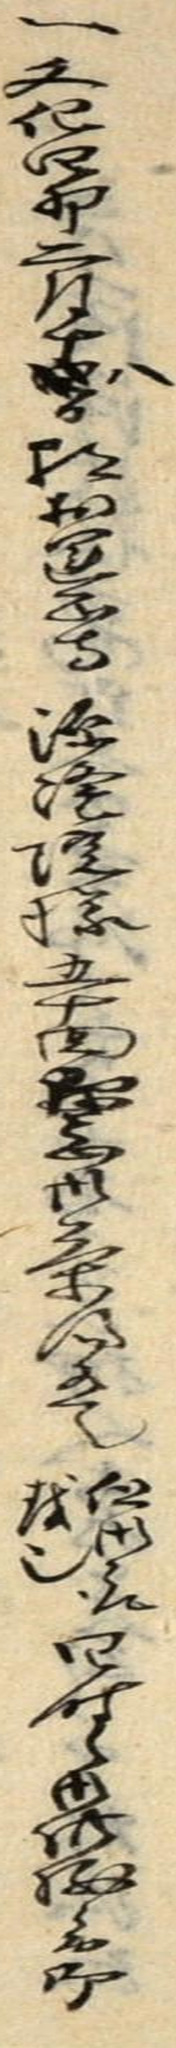一文化四卯二月十八日朝於運正寺源隆院様五十回御忌御茶湯有之但御取越也四時之御供揃に而御
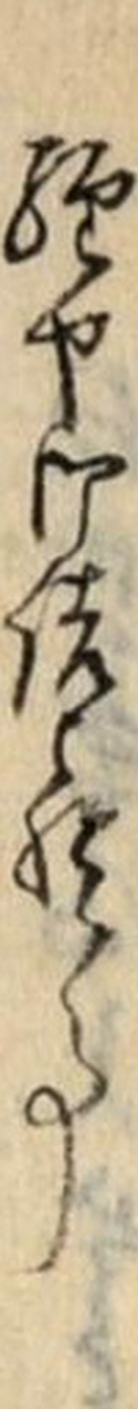経中御詰被遊候事

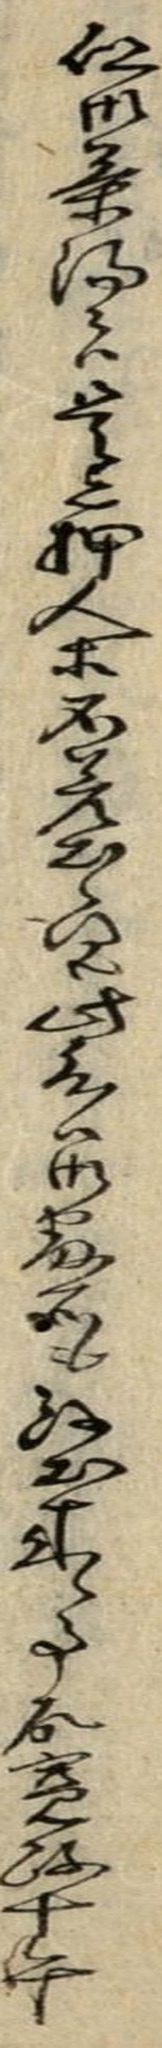但御茶湯には是迄押人等不差出候得共此度は御番所も致出来候事故寛政十年
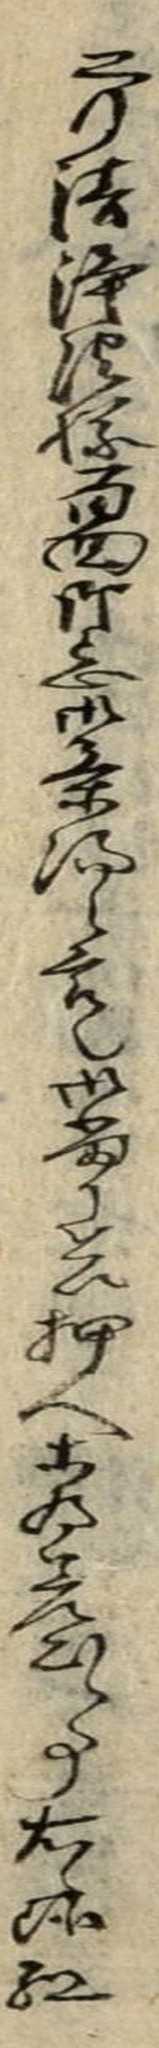二月清浄院様百回御忌御茶湯之節之御当りを以押人等為差出候事右之趣組
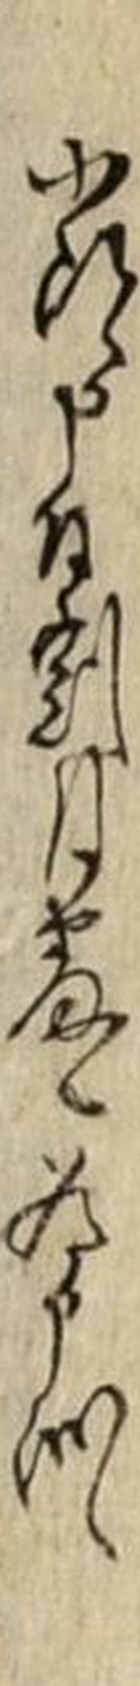小頭へ申付割月番へ為申越候
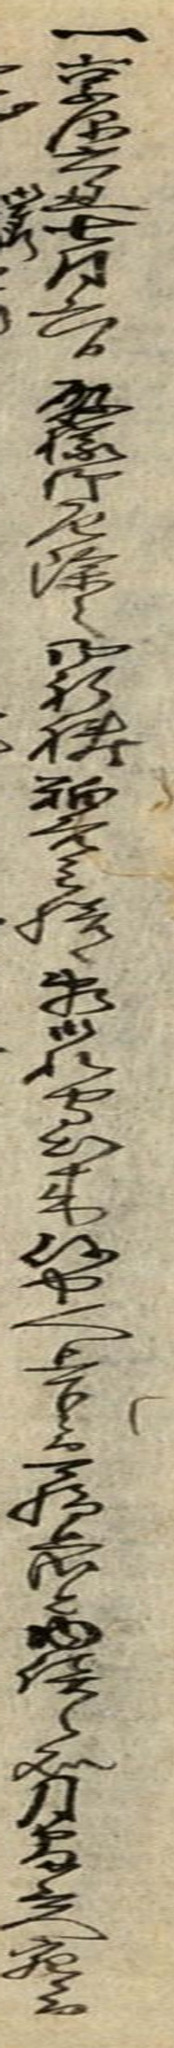一享保六丑七月六日殿様御厄除御祈祷粕谷主膳へ頼御札守出来役中人上下に而可指上哉と内談候処月番壱人宛に而
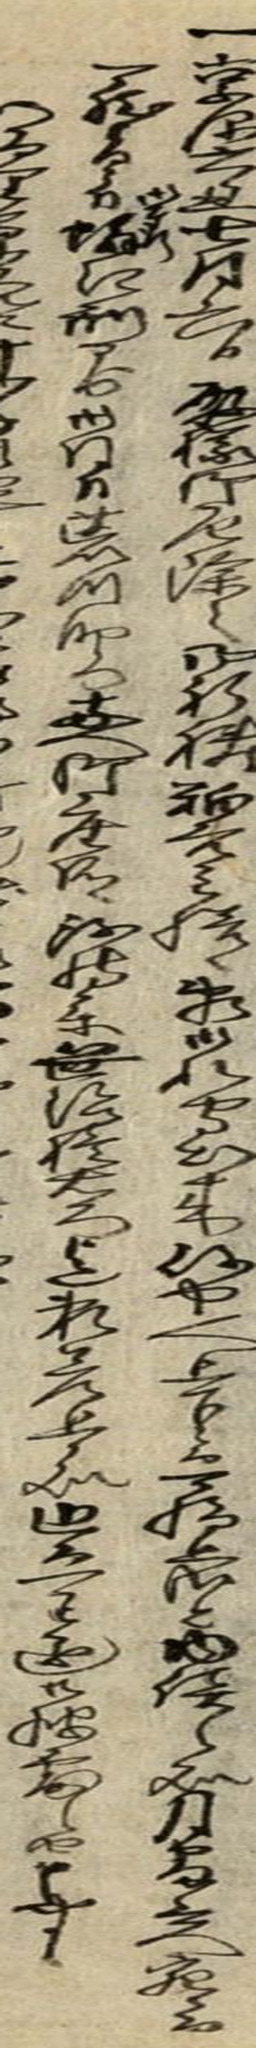可然旨に付御奉行坂口刑部右衛門御目付荒川助右衛門両人御座所へ致持参笹治権右衛門迄頼差上候処追而可被遂御披露之由申聞候
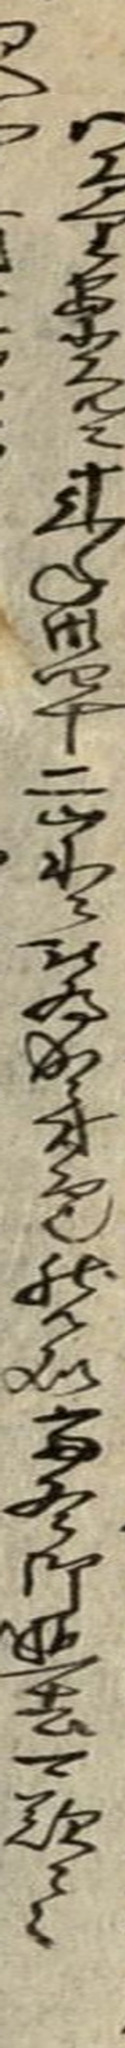八百里案するに来年御四十二歳に被為成に付而也然る処当冬御逝去可歎く嘆に候
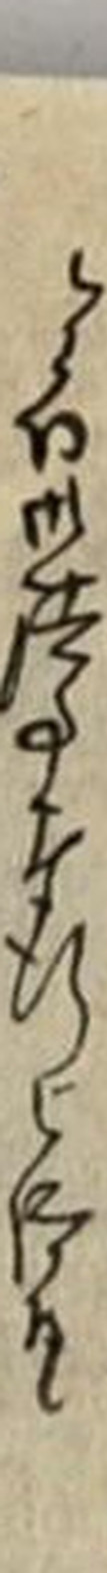候に付御法事奉行被仰付候
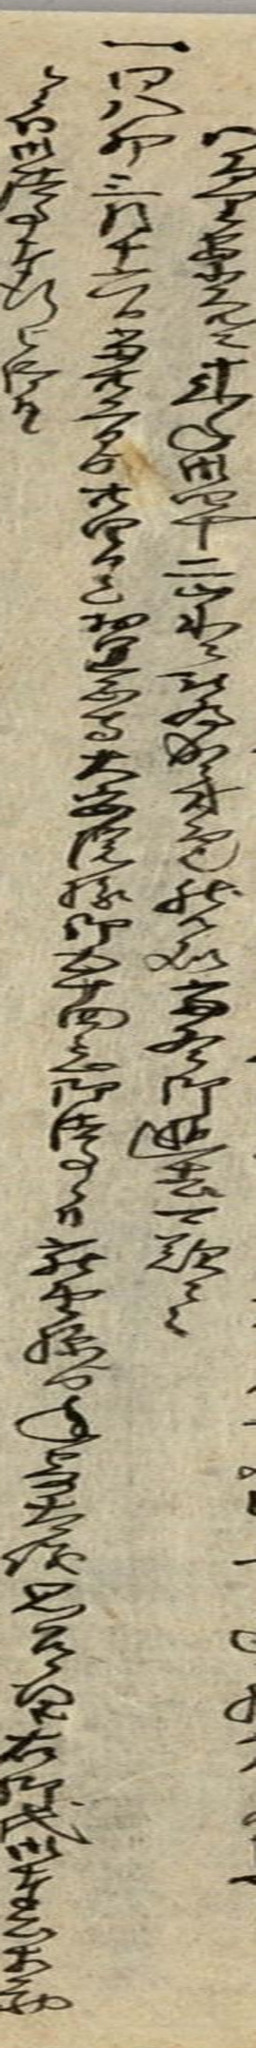一同八卯三月十六日当廿二日ゟ廿四日迄於運正寺大安院様御五十回忌御法事に付荻野孫右衛門年寄太儀思召候得共右御代御奉公相勤
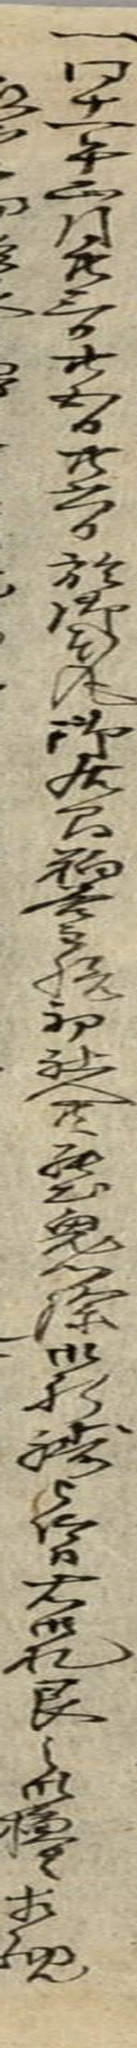一同十一午二月廿三日廿五日廿六日於御本丸御居間粕谷主膳初社人共罷出鬼門除御祈祷被仰付右御札艮之御櫓へ相納る
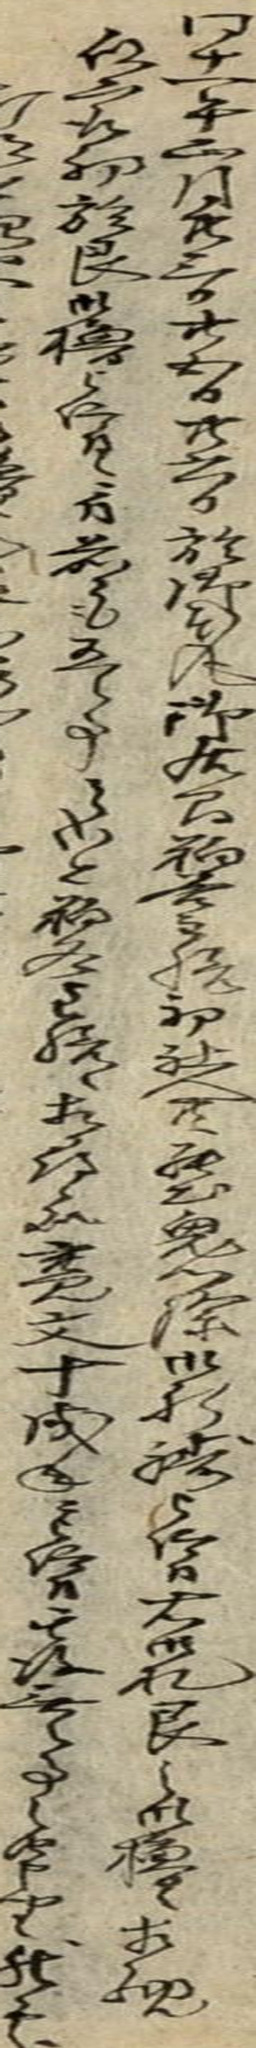但最初於艮御櫓被仰付候に付前ニも有之事に候哉と粕谷主膳へ相尋候処寛文十戌年に被仰付其後無之事之由申聞候然処
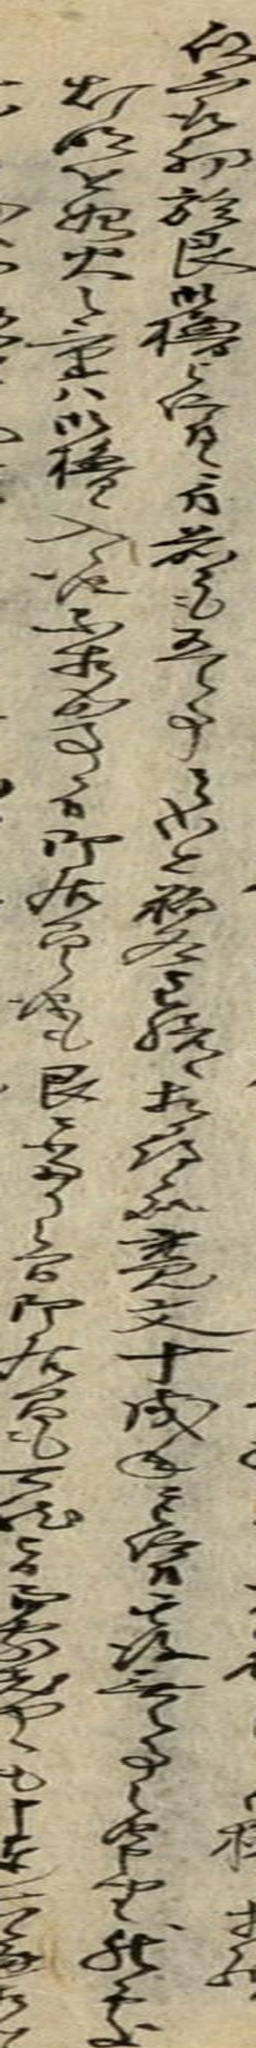灯明を始火之気は御櫓へ入候儀不相成事に付御居間之儀も艮に当り候間御居間も可然旨御家老中へも申達右之通相成
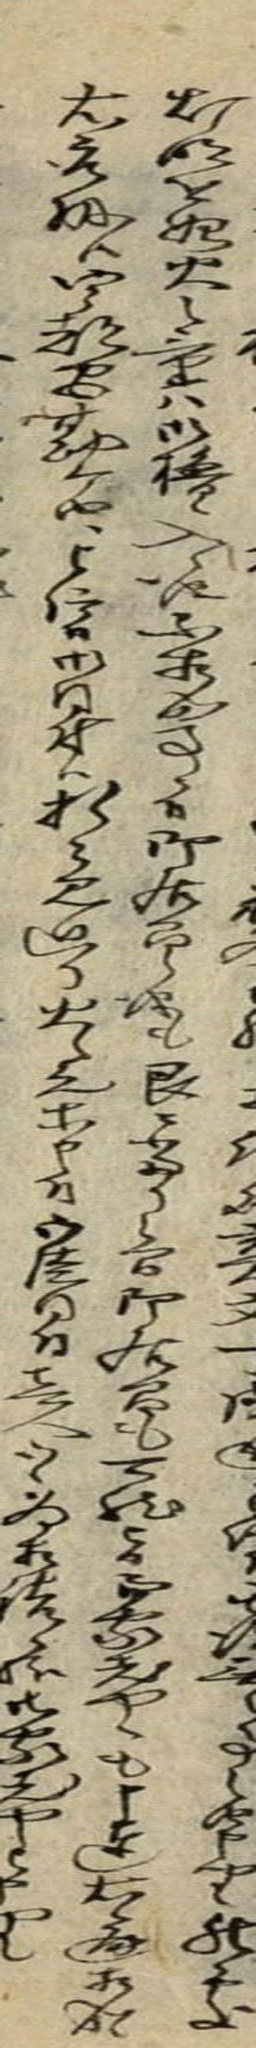右取扱は宇都宮勘ケ解由へ被仰付御目付は折々見廻り火之元等申付御徒目付壱人ツゝ為相詰候様御家老中被申聞候
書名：蒐輯之部
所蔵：福井県文書館 Fukui Prefectural Archives
